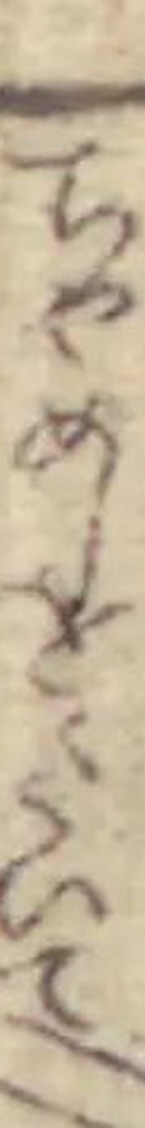ちやめしをたいて
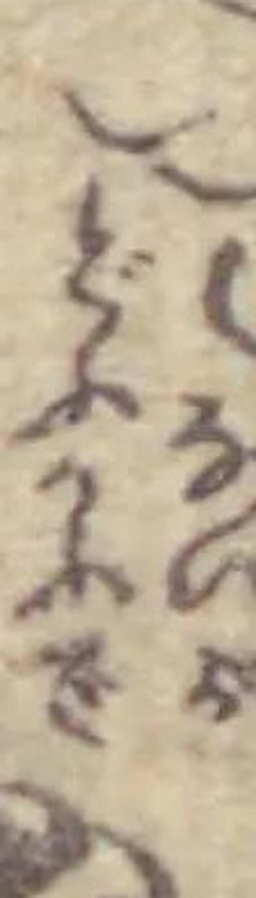どふかふで
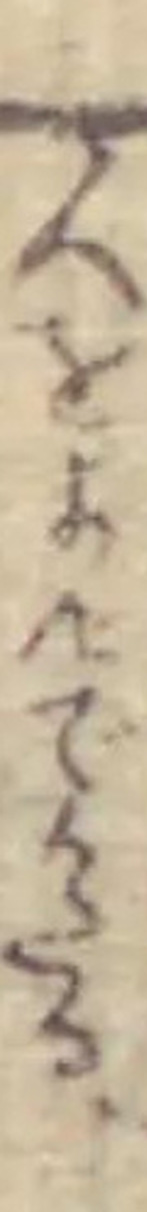人をよんでかたる
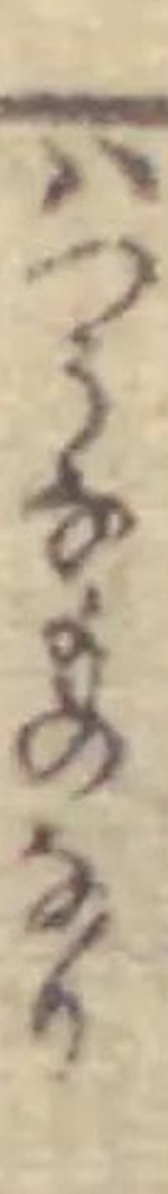はつうなものなり
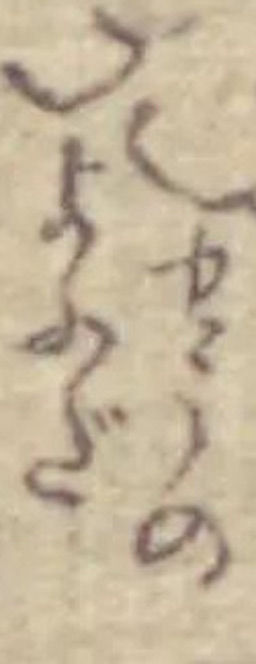よふだ
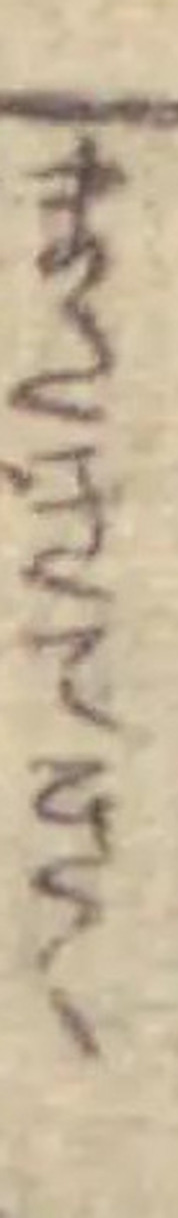またきてきく
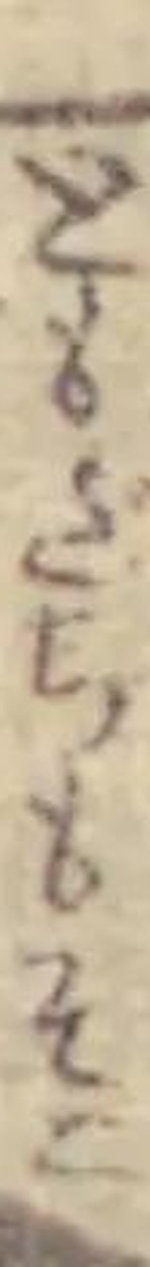ともだちもそこ
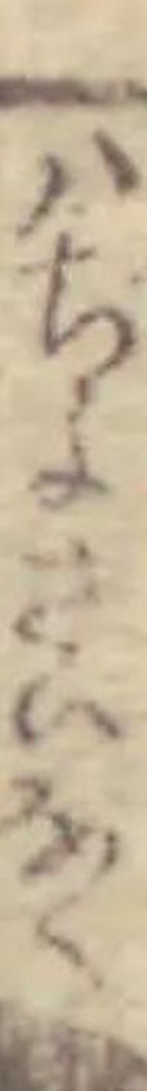はぢよさいなく
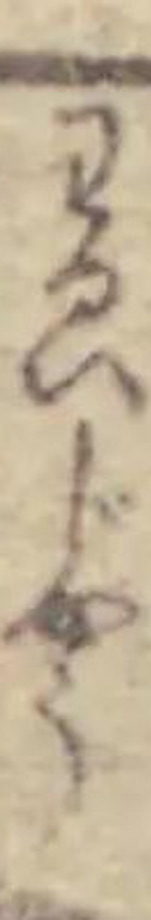わるいじやう
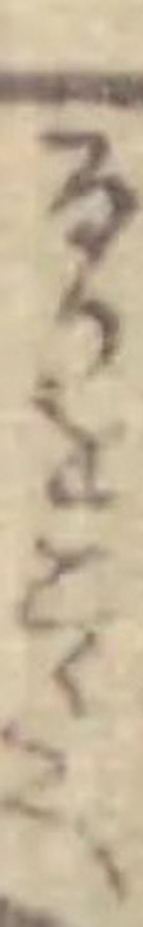るりをこたへ
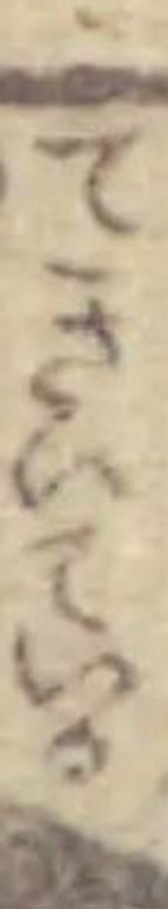てきいている
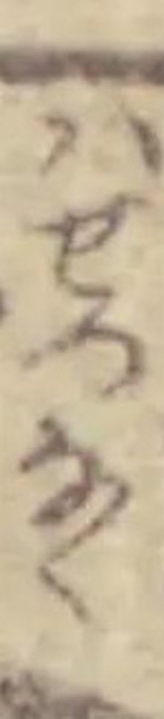はせつなく
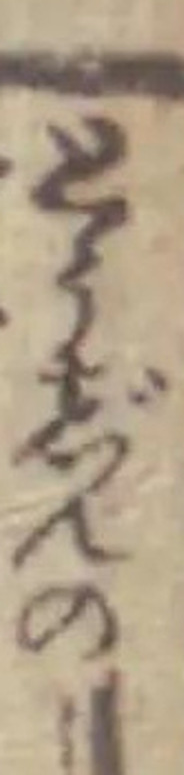とうじんの
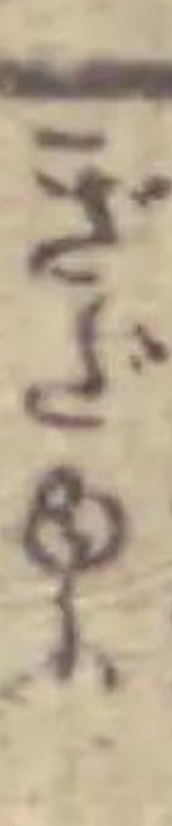ぎだゆふ
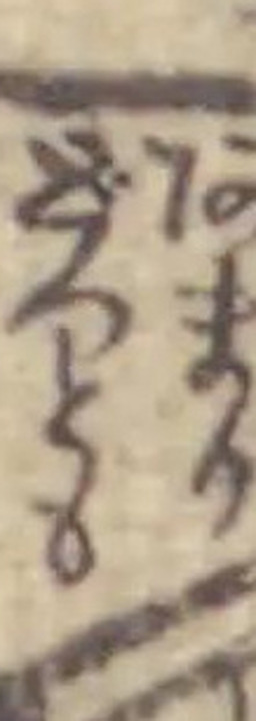どつとも
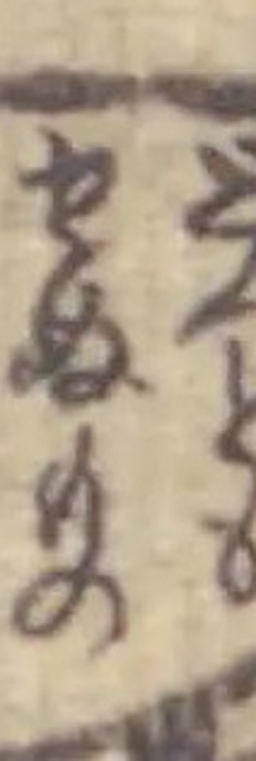せぬもの
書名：茶羅毛通人 3巻
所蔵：国立国会図書館 National Diet Library, JAPAN
